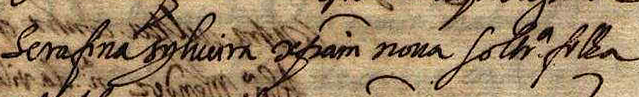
Serafina sylueira xpām noua soltra filha
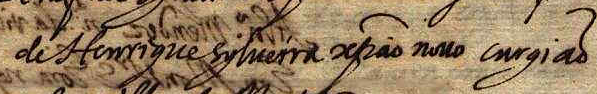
de Henrique sylueira xpão nouo curgiaõ
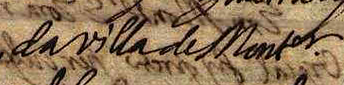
da villa de Montor.
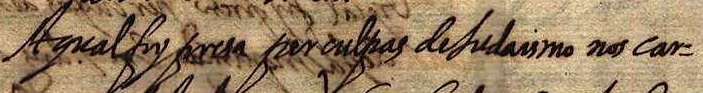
A qual foy presa per culpas de Iudaismo nos car
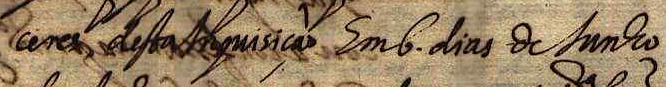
ceres desta Inquisição Em 6. dias de Iunho
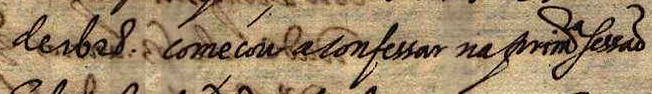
de 1628. começou a confessar na primra sessão
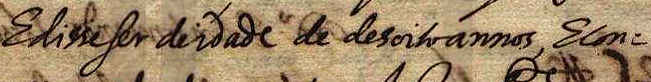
E disse ser de idade de desoito annos, E con
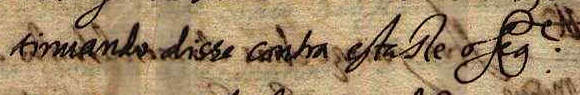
tinuando disse contra esta Re o segte:
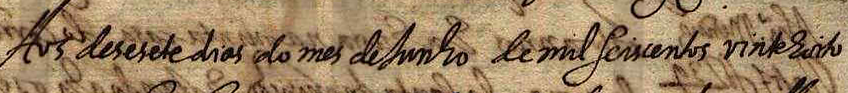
Aos desesete dias do mes de Iunho de mil seiscentos vinte E oito
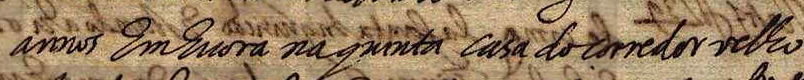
annos Em Euora na quinta casa do corredor velho
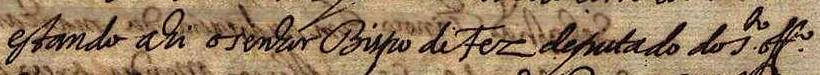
estando ahi o senhor Bispo de Fez deputado do s.to off.o
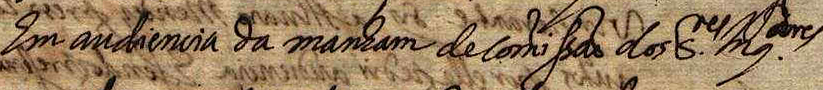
Em audiencia da manham de comissão dos s.res Inq.dores
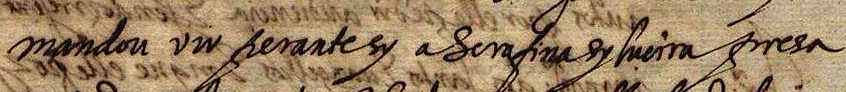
mandou vir perante sy a Serafina sylueira presa
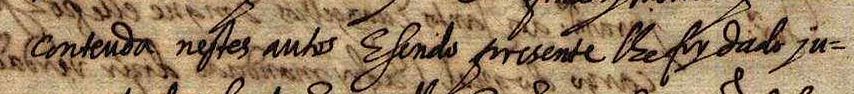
conteuda nestes autos E sendo presente lhe foy dado ju
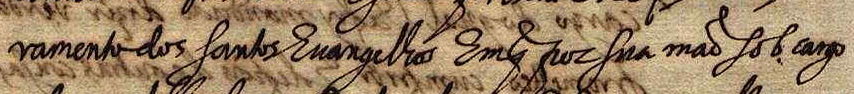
ramento dos Santos Euangelhos Em q̄ poz sua maõ sob cargo
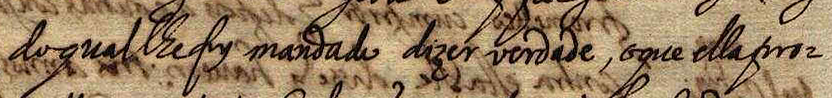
do qual lhe foy mandado dizer verdade, o que ella pro
